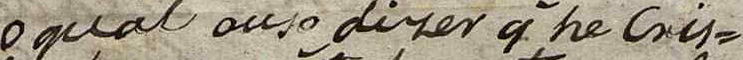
qual ouso dizer q̄ he Cris
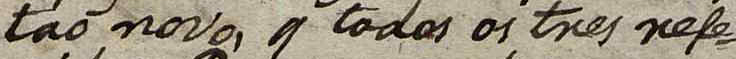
taõ novo, q̄ todos os tres refe
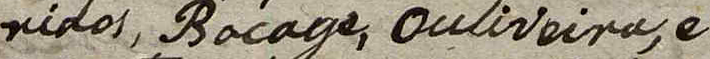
ridos, Bocage, Ouliveira, e
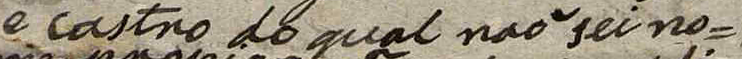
e Castro, do qual naõ sei no
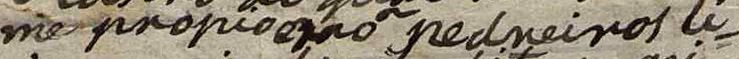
me proprio eraõ pedreiros li
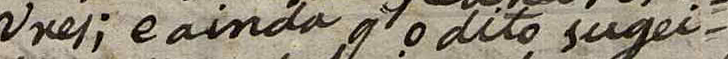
vres; e ainda q̄ o dito sugei
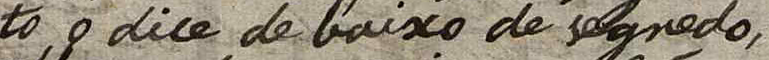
to o dice debaixo de segredo,
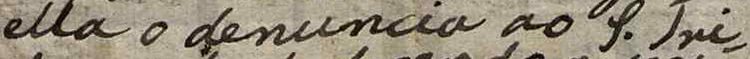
ella o denuncia ao S. Tri
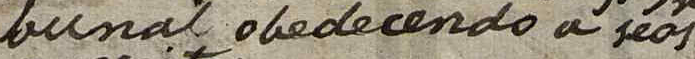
bunal, obedecendo a seos
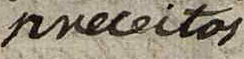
preceitos.
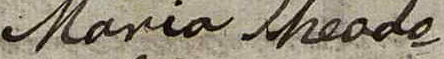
Maria Theodo
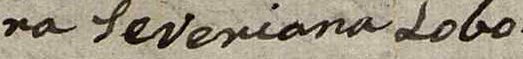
ra Severiana Lobo.
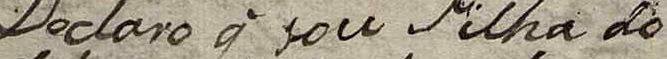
Declaro q̄ sou Filha do
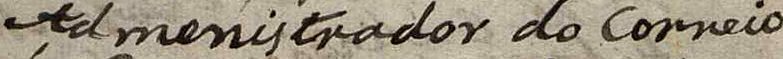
Administrador do Correio
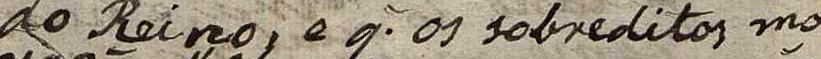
đo Reino, e q̄ os sobreditos mo
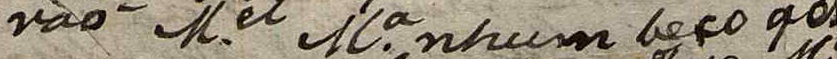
raõ Mel Ma nhum beco q̄ es
